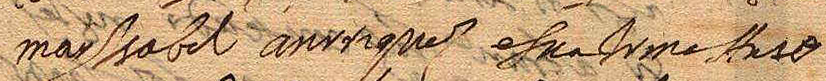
may Isabel anrriques e sua Irma Anto
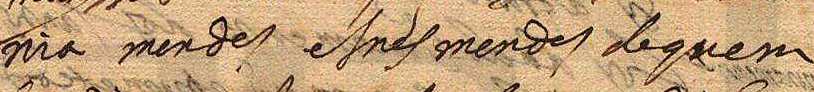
nia mendez e Jnes mendez de quem
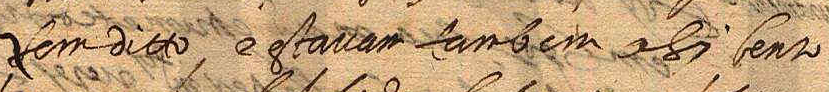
tem ditto, e estauam tambem ahj bento
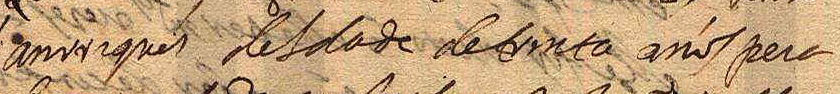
anrriques de Idade de trinta an̄os pera
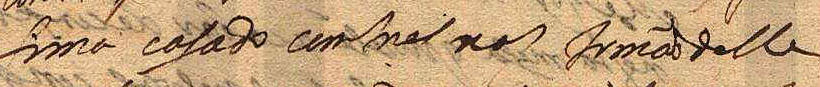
sima casado com Ines uaz Jrmão delle
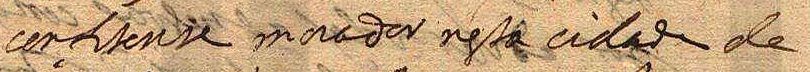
confitente morador nesta cidade de
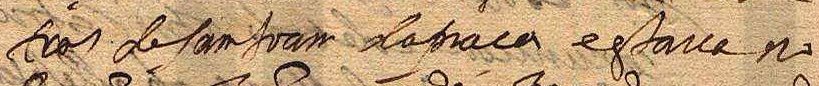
tras de sam Joam da praça e estaua no
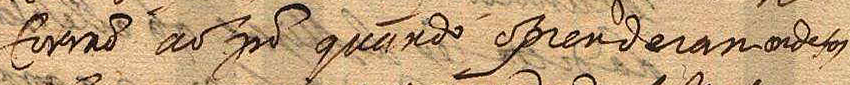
torraõ ao tpō quando o prenderam onde foj
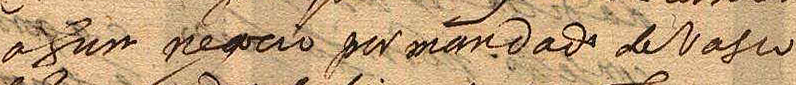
a hum negocio por mandado de vasco
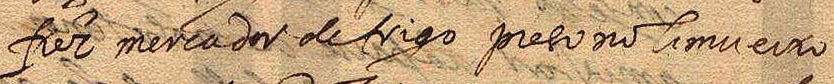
frez̄ mercador de trigo preso no limueiro
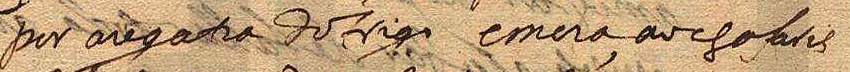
por aregatia? do trigo e mora ao chafaris
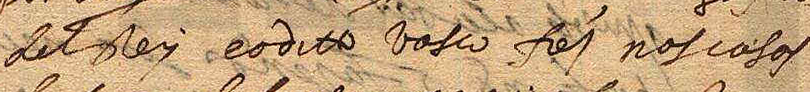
del Rey e o dito vasco frz̄ nas casas
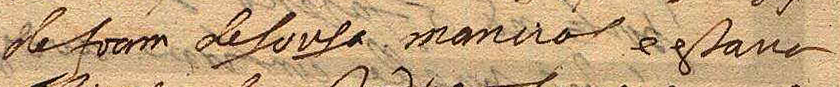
de foam de sousa maniras e estaua
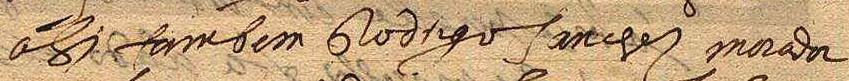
ahj tambem Rodrigo Sanches morador
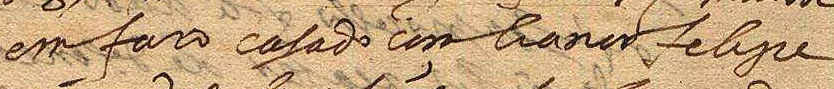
em faro casado com lianor felipe
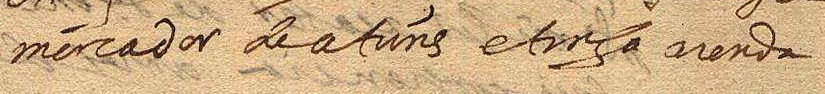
mercador de atuns e tinha uenda
